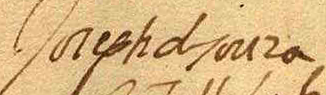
Jozeph d souza
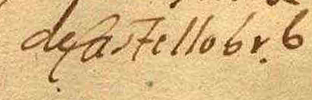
de Castello br.o
